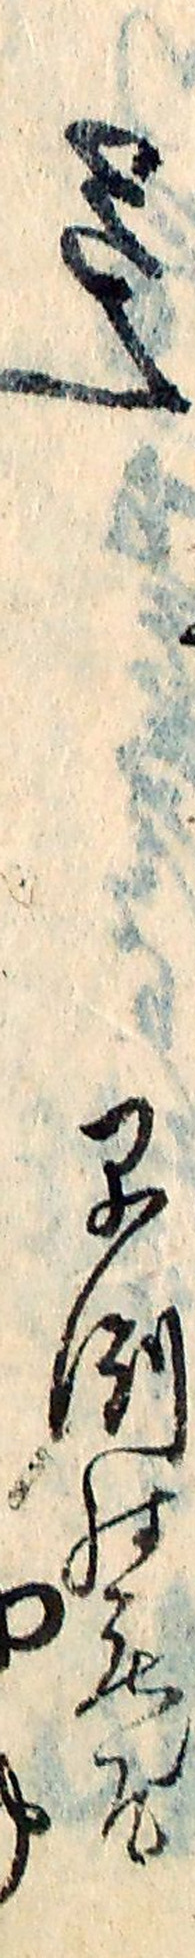早淵村庄屋
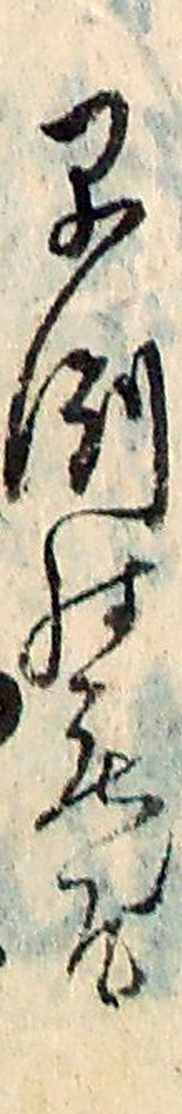早淵村庄屋
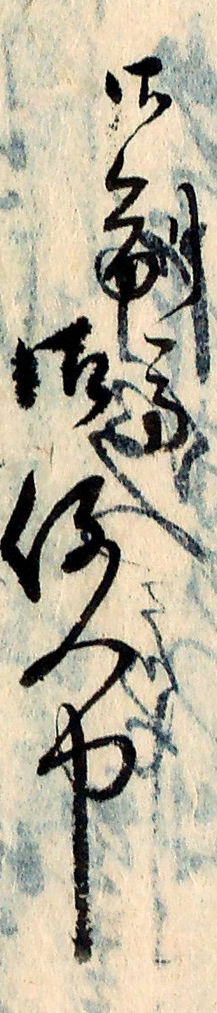御役人中
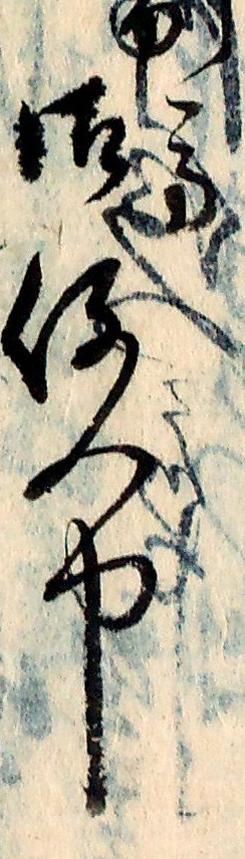御役人中
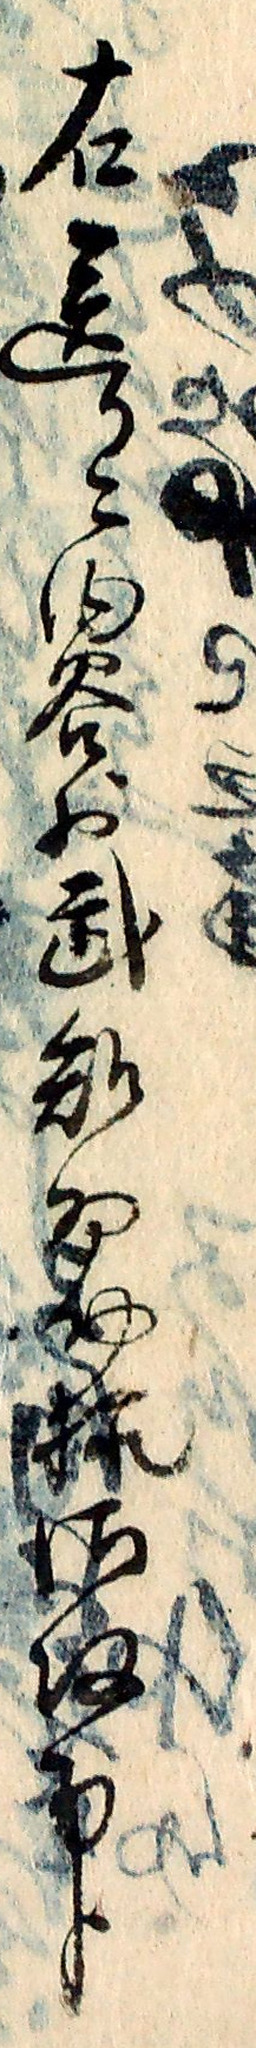右送りに内谷村武知為助様御改印

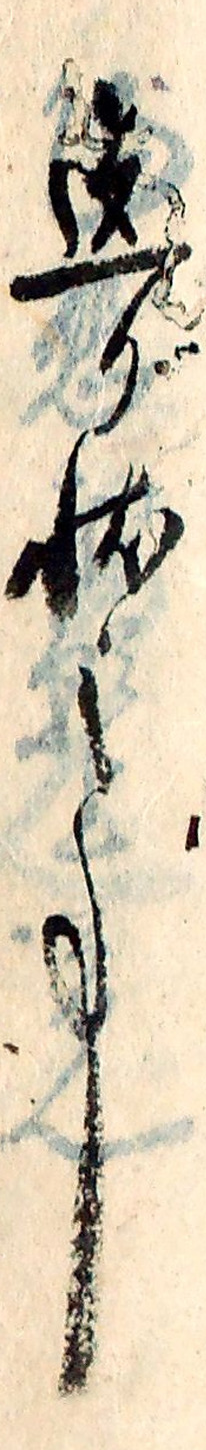送り状之事
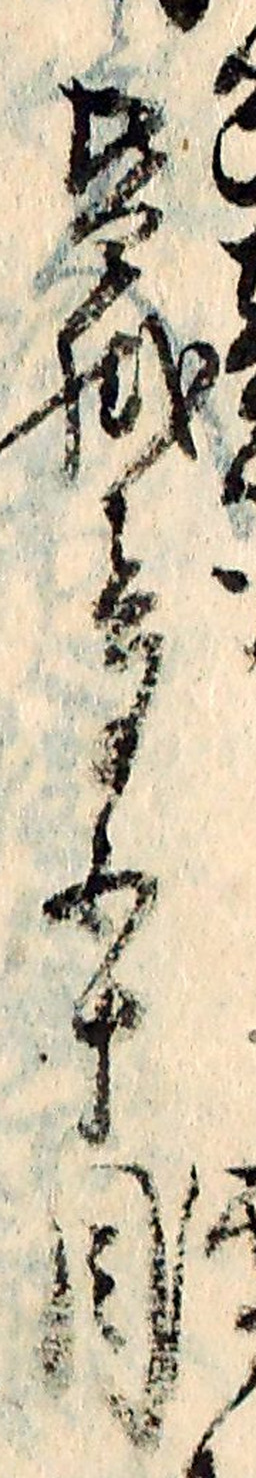皆掛壱貫五十目
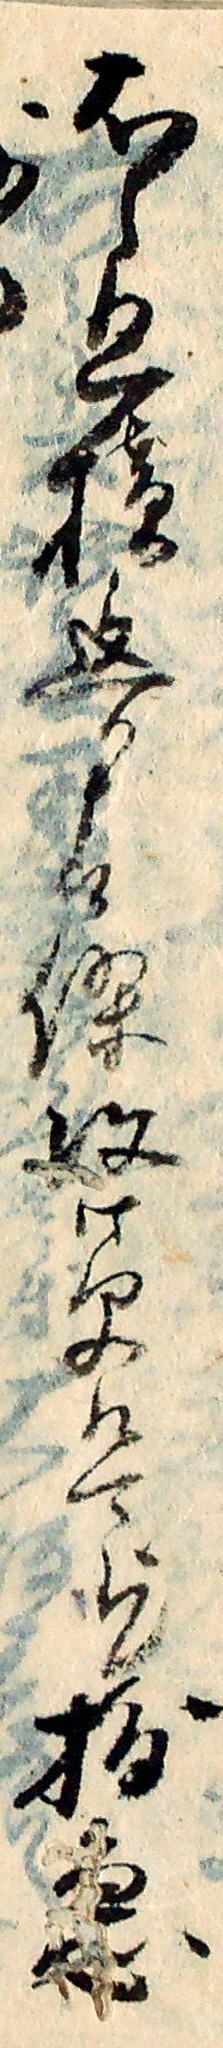右之通積送り申候条改御受取可被下候指急
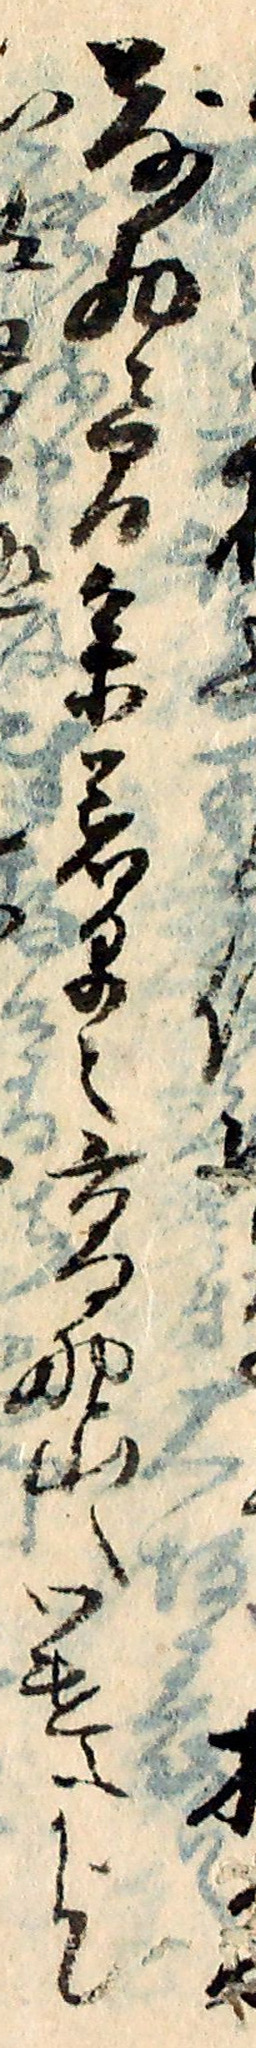荷物候間参着早々高野山へ御遣し可被下候
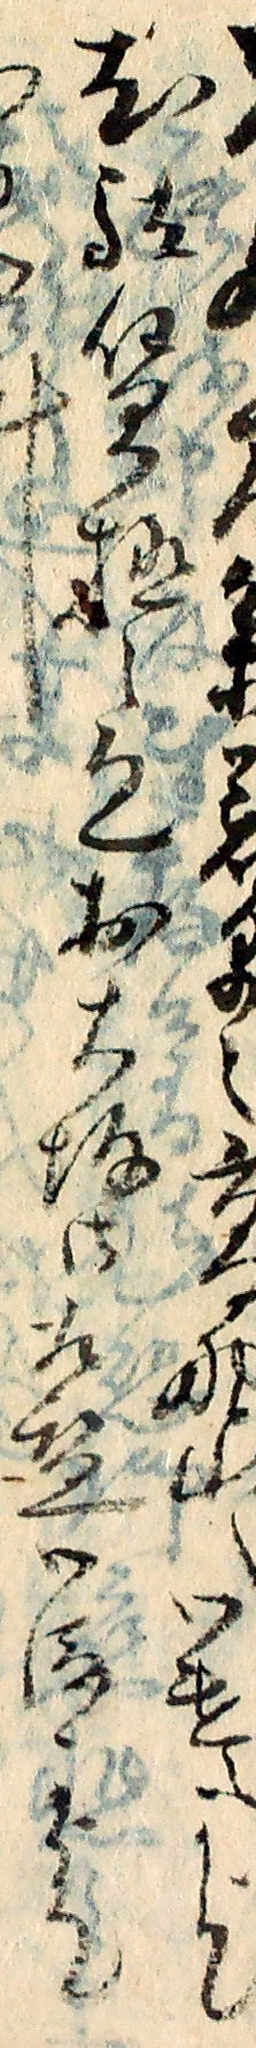尤駄賃極之通於大坂御取替御渡可被下候
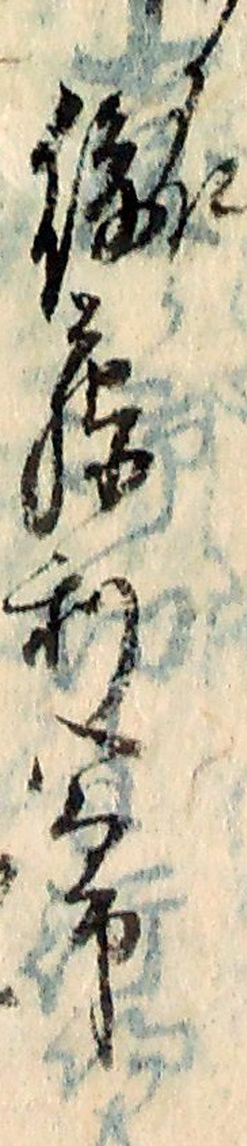後藤利八郎
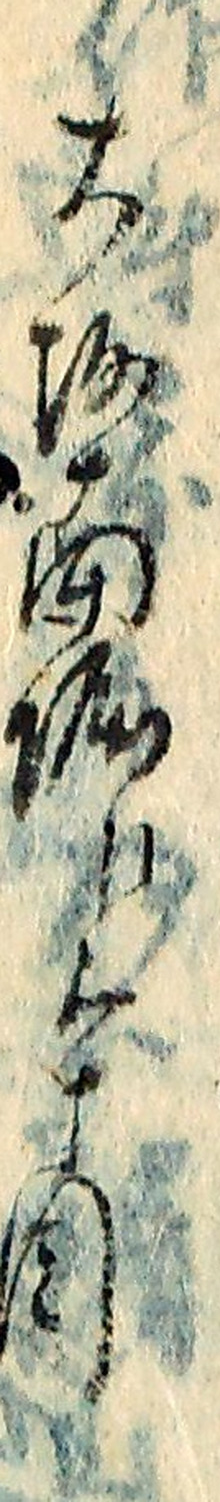大坂南堀江三丁目
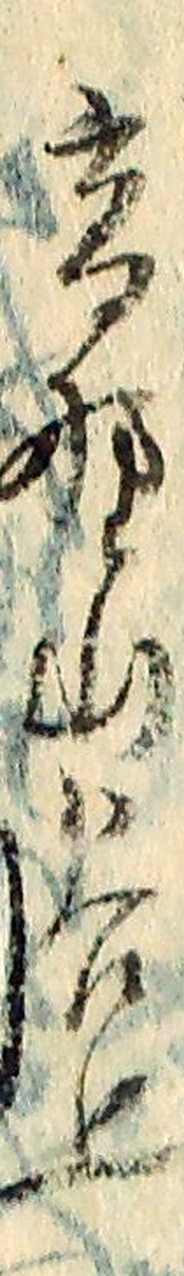高野山谷上
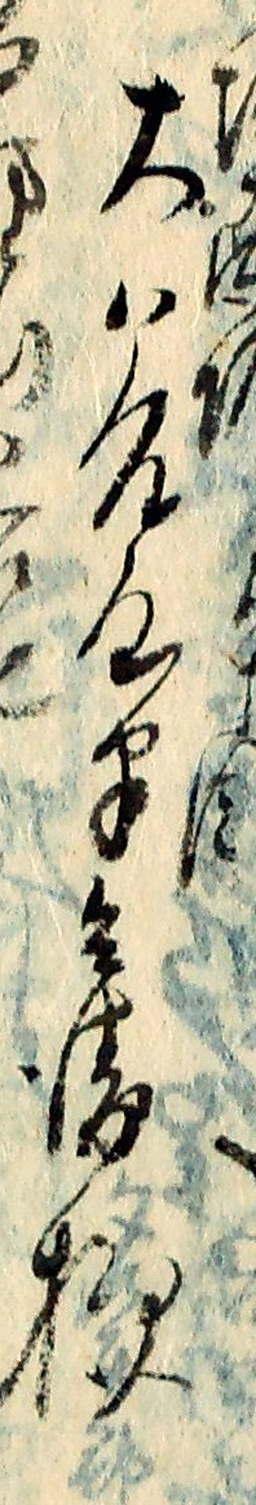大谷屋半兵衛様
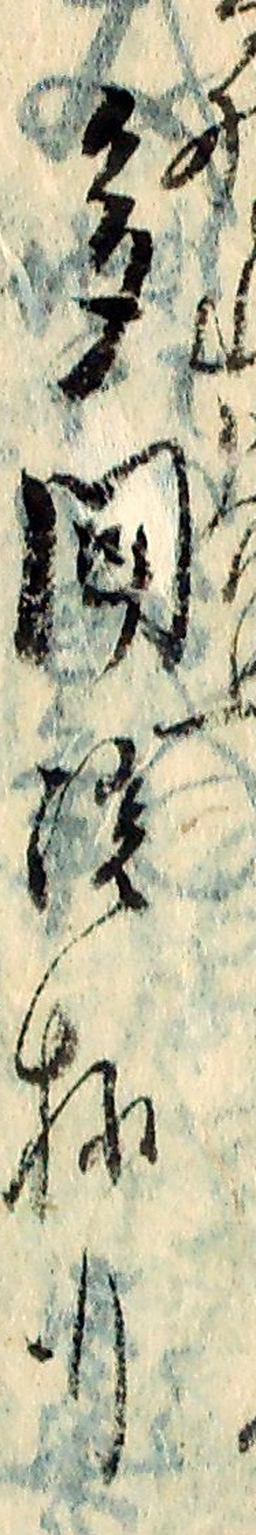多聞院様行
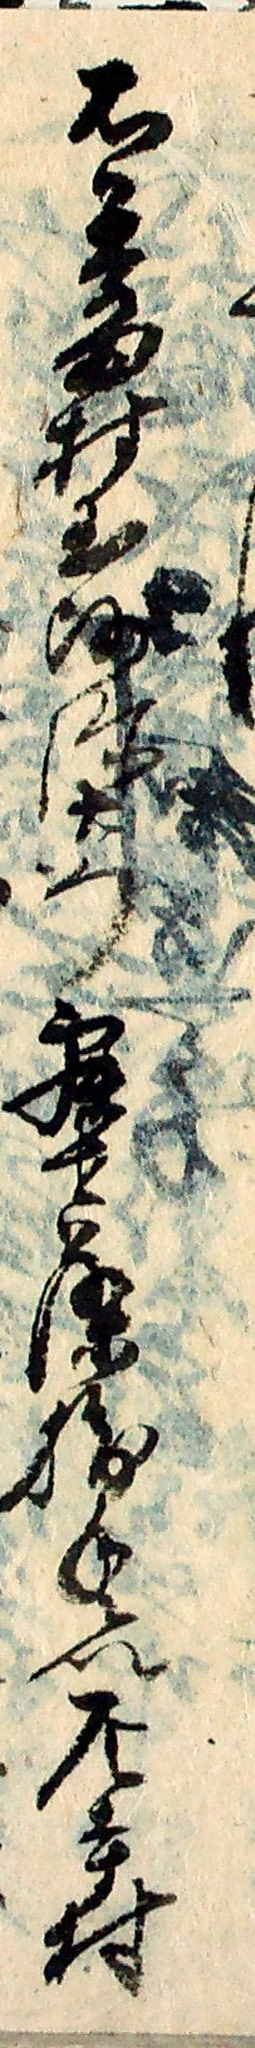右は吉田村玉師弥右衛門寐せ蒅勝手を以尼寺村
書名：諸御願書控(後藤氏壱番）
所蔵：鳴門教育大学 Naruto University of Education
